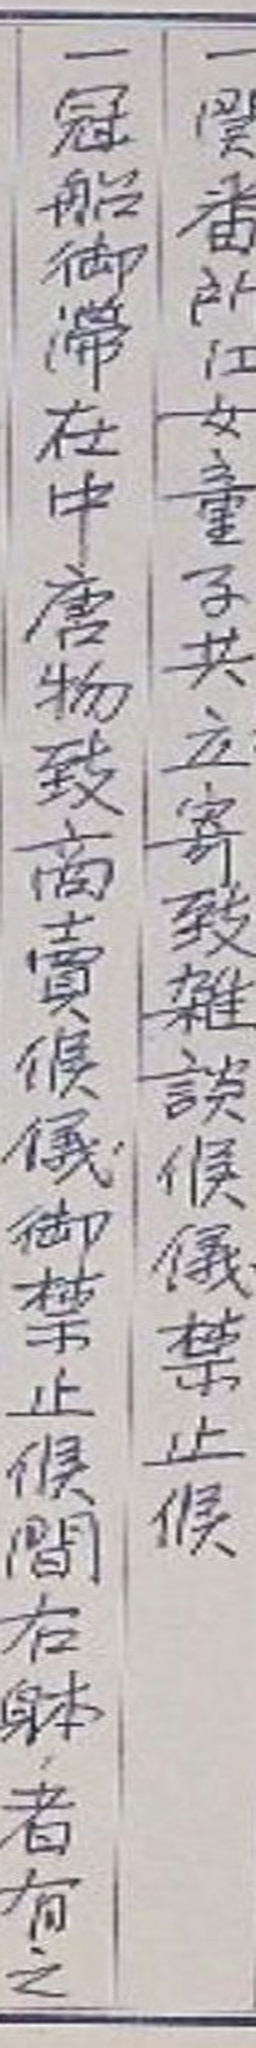一冠船御滞在中唐物致商売候儀御禁止候間右躰の者有之
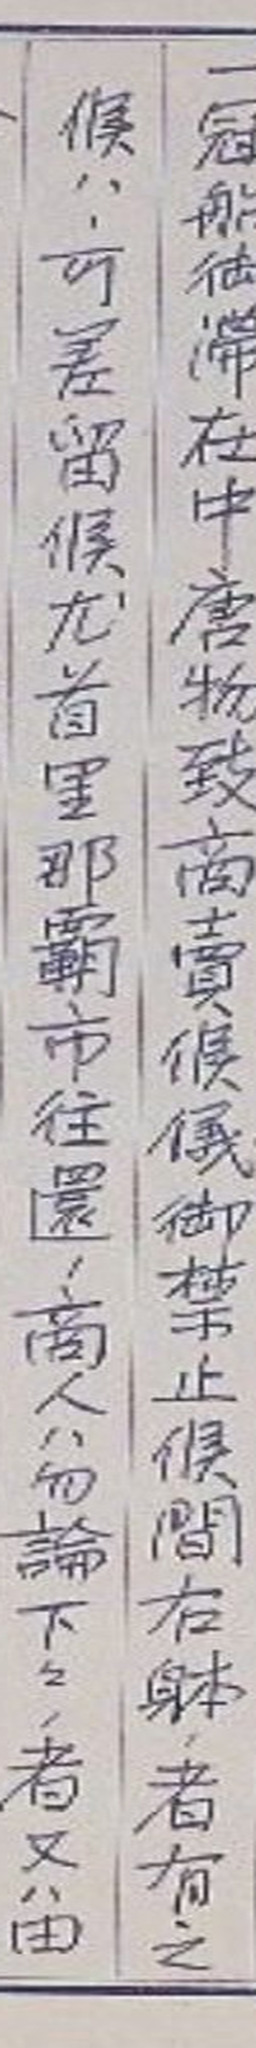候はゝ可差留候尤首里那覇市往還の商人は勿論下々の者又は田
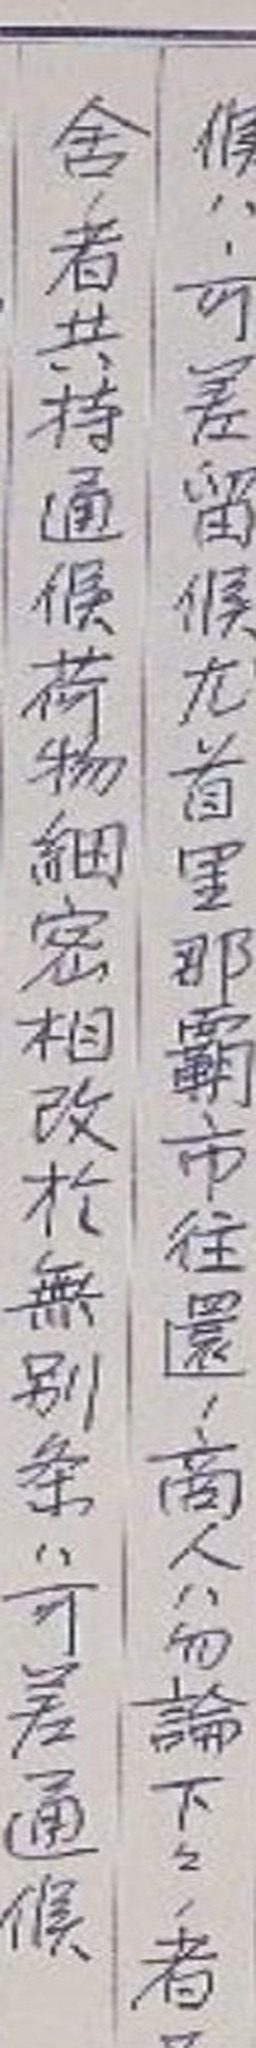舎の者共持通候荷物細密相改於無別条は可差通候
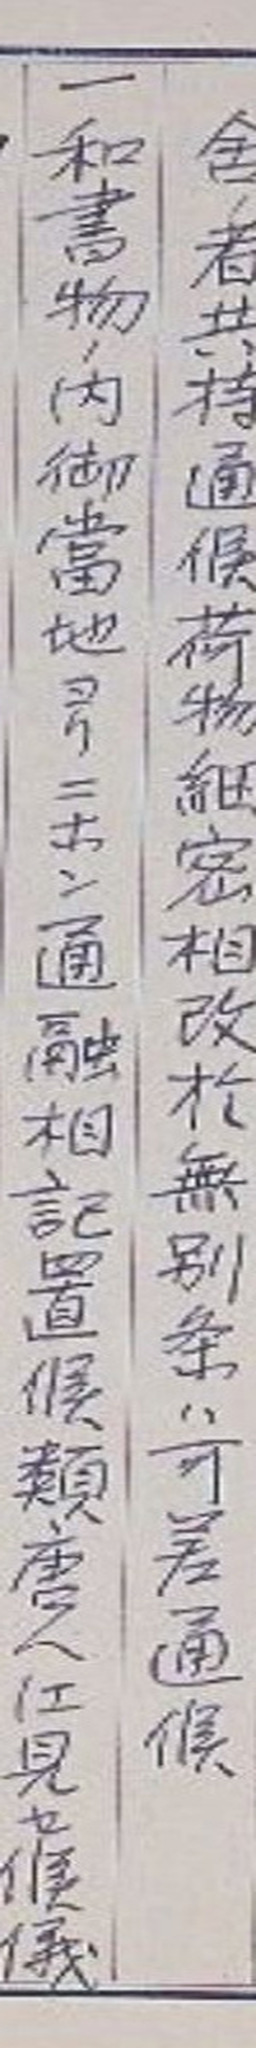一和書物の内御当地よりにほん通融相記置候類唐人え見せ候儀
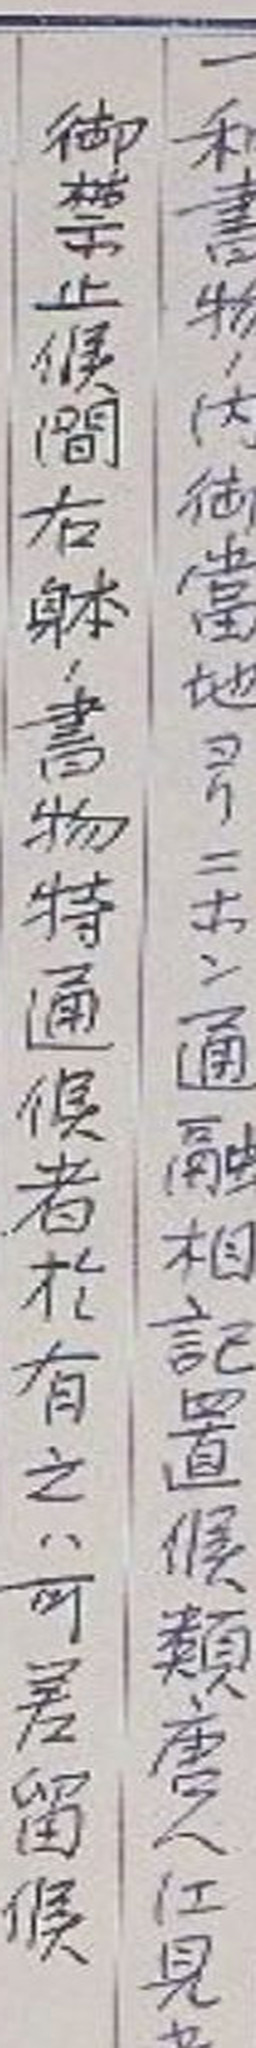御禁止候間右躰の書物特通候者於有之は可差留候
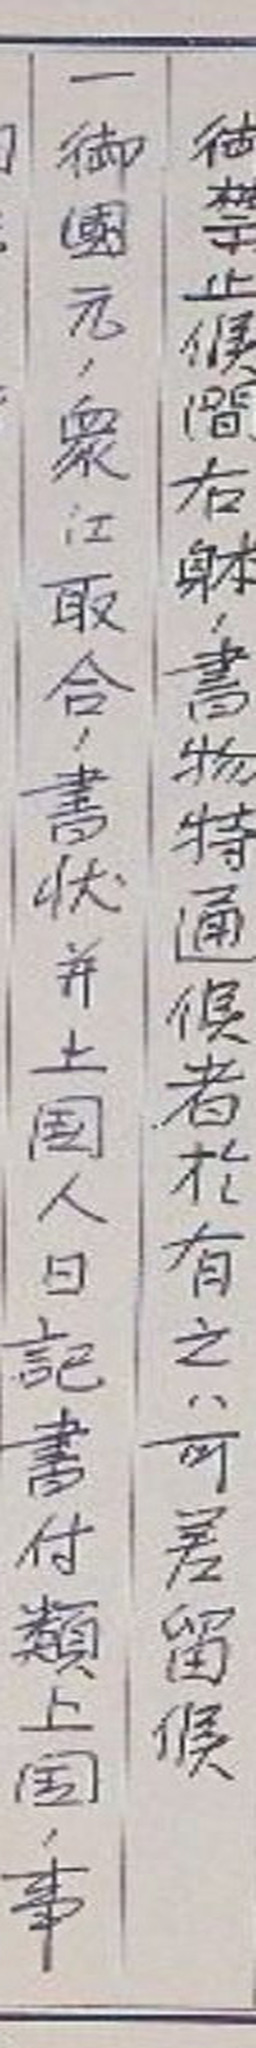一御国元の衆え取合の書状并上国人日記書付類上国の事
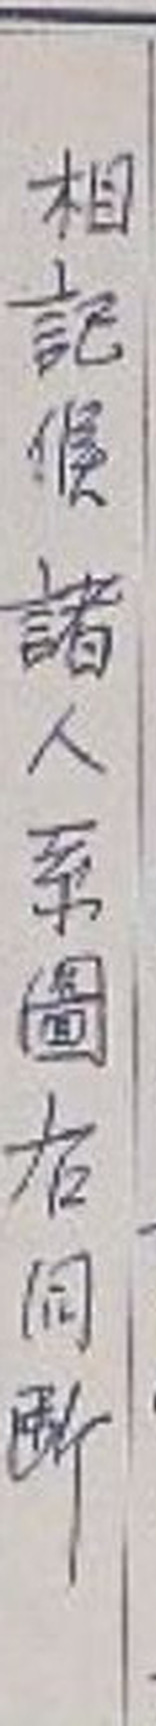相記候諸人系図右同断
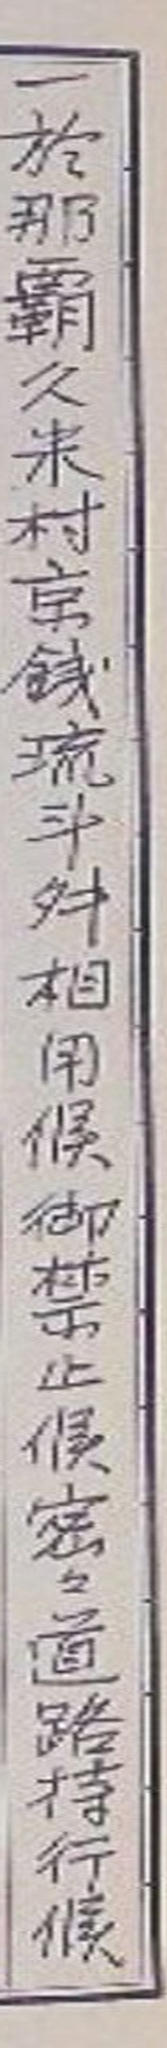一於那覇久米村京銭琉斗舛相用候御禁止候密々道路持行候
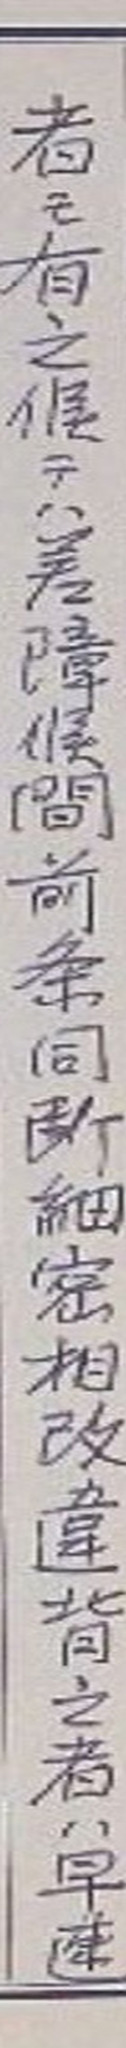者も有之候ては差障候間前条同断細密相改違背之者は早速
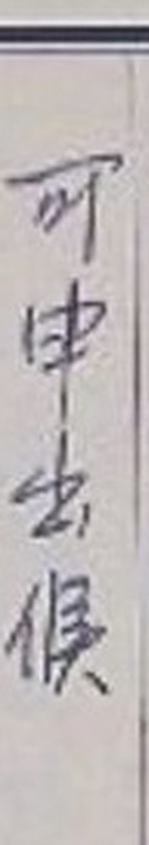可申出候
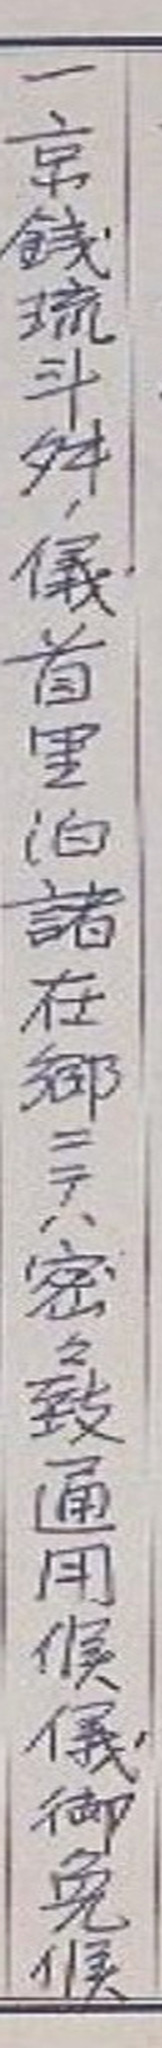一京銭琉斗舛の儀首里泊諸在郷にては密々致通用候儀御免候
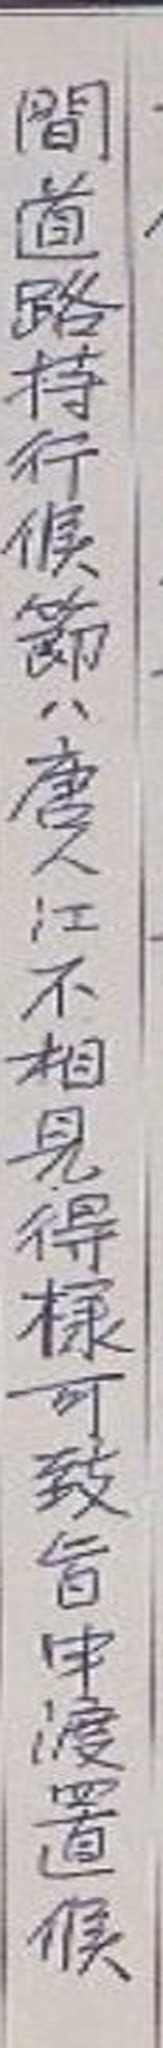間道路持行候節は唐人え不相見得様可致旨申渡置候
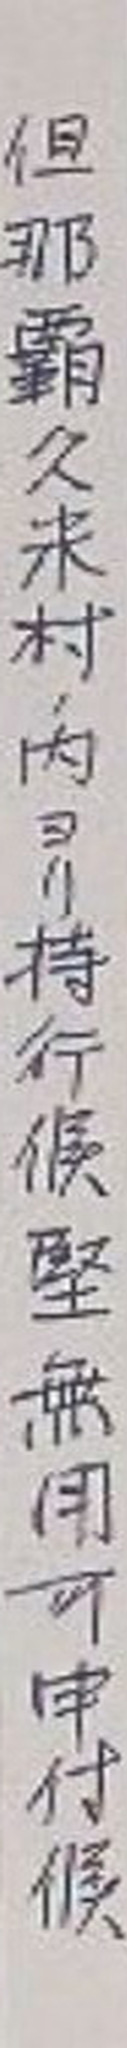但那覇久米村の内より持行候堅無用可申付候
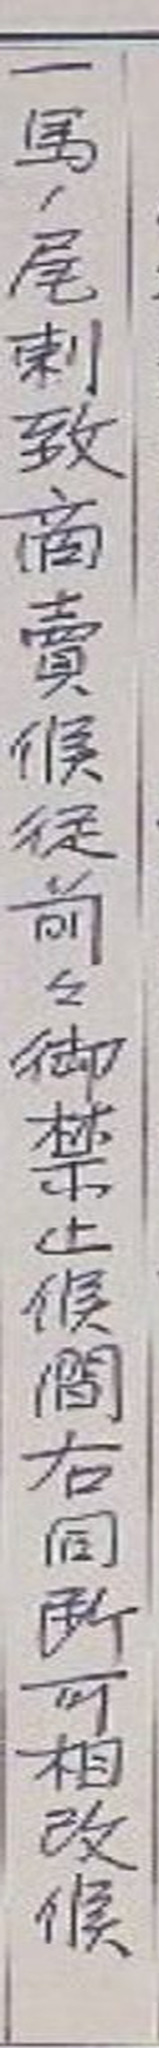一馬の尾刺致商売候従前々御禁止候間右同所可相改候
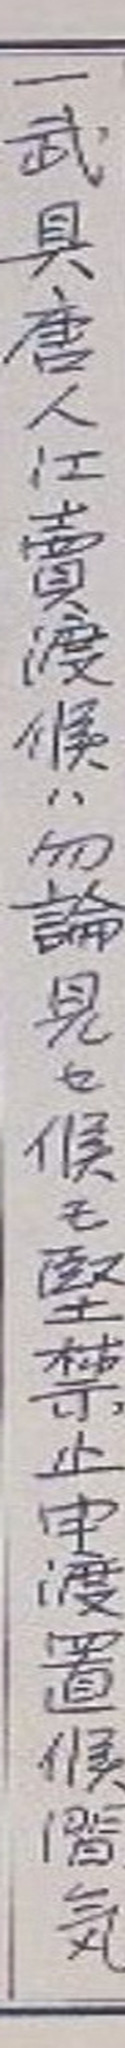一武具唐人え売渡候は勿論見せ候も堅禁止申渡置候間気
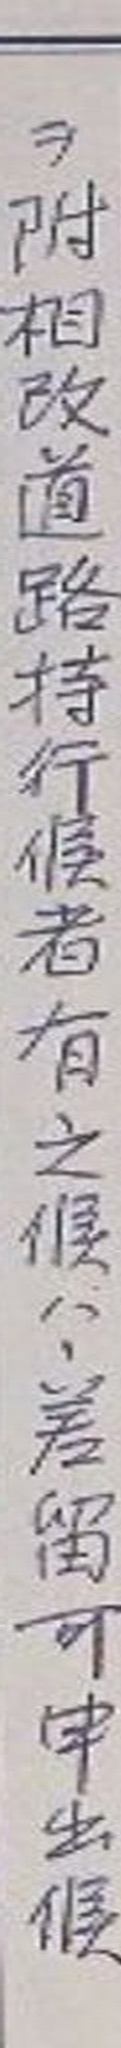を附相改道路持行候者有之候はゝ差留可申出候
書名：支那冊封使来琉諸記 下巻
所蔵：University of the Ryukyus Library
